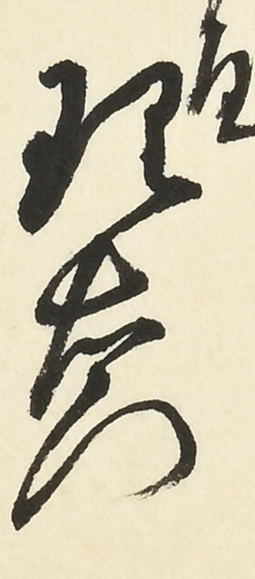平右衛門
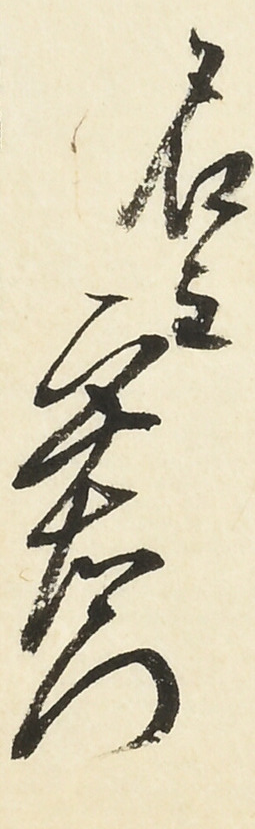平右衛門
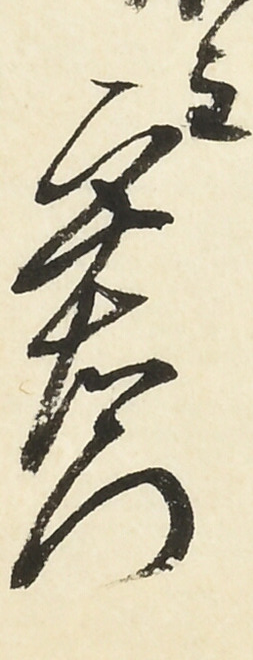平右衛門
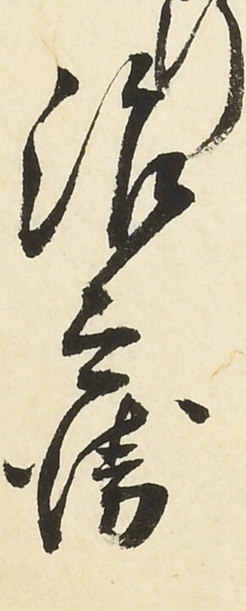治兵衛

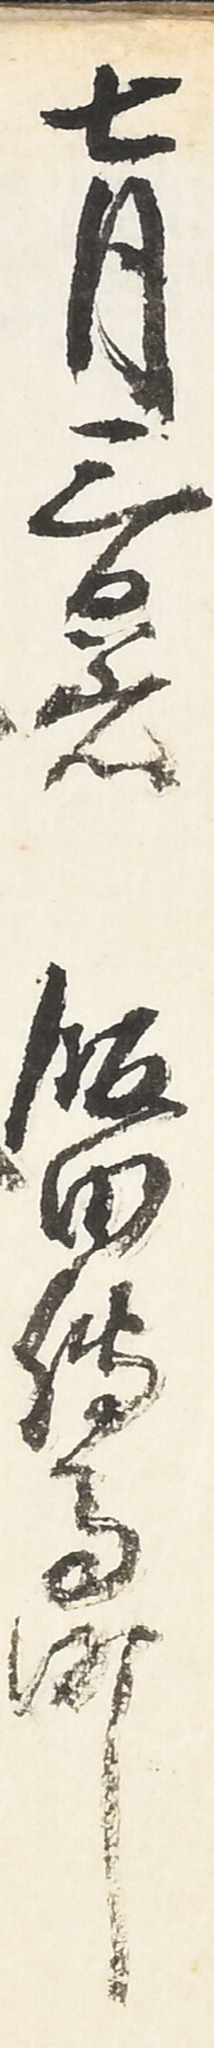七月三日着飯田伝馬町
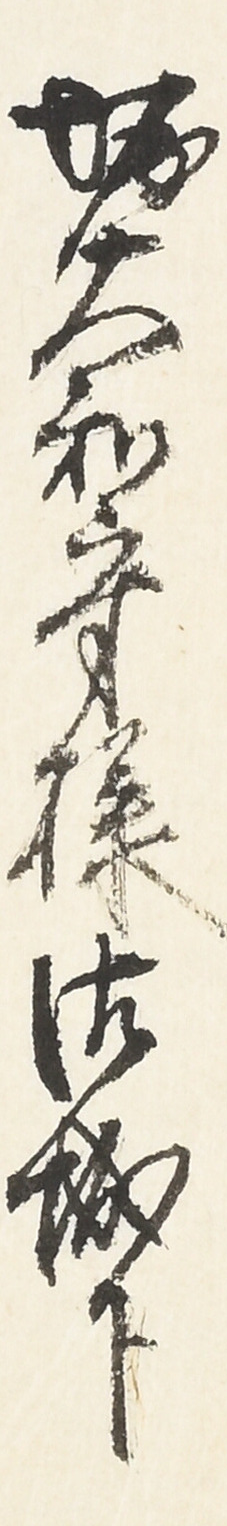堀大和守様御城下
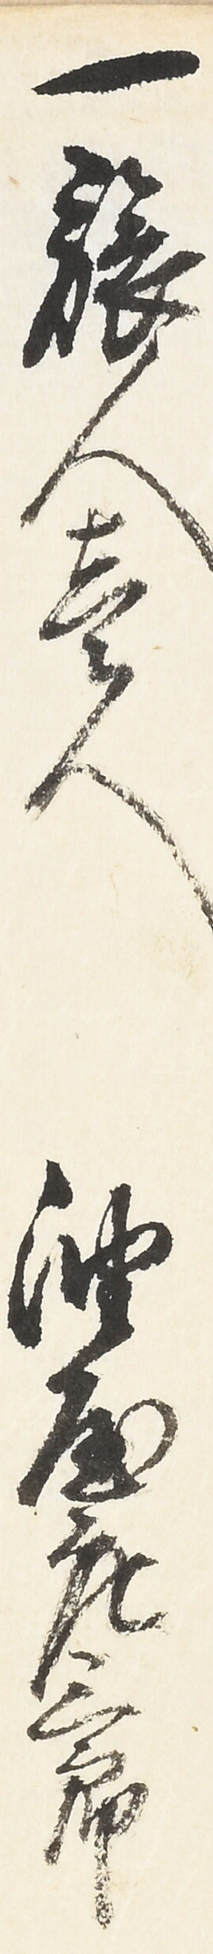一旅人壱人油屋庄三郎
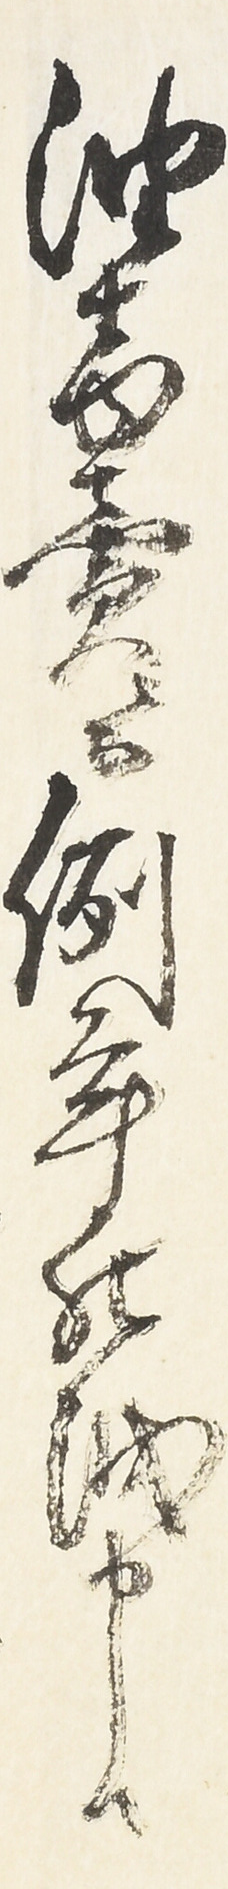油商売ニ而例年罷越申候
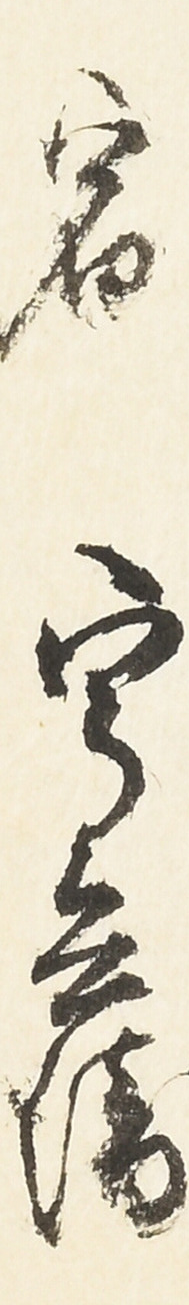宿宇兵衛
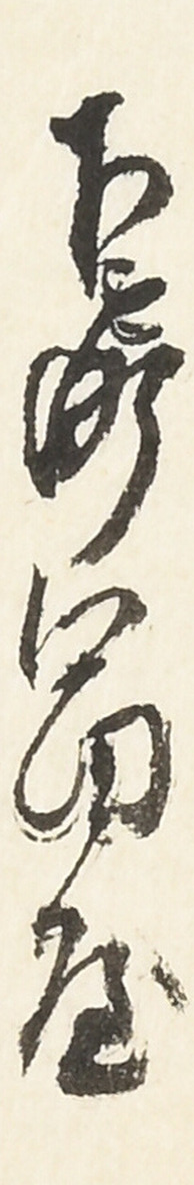下モ町冨屋
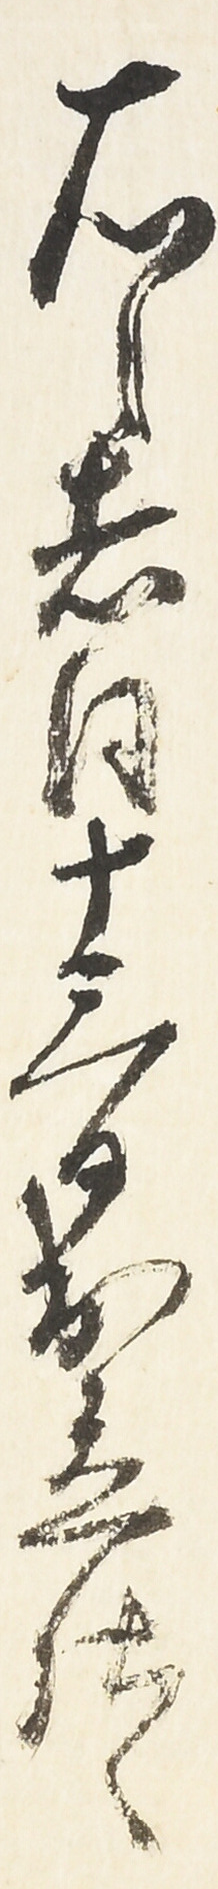右之者同十三日出立仕候
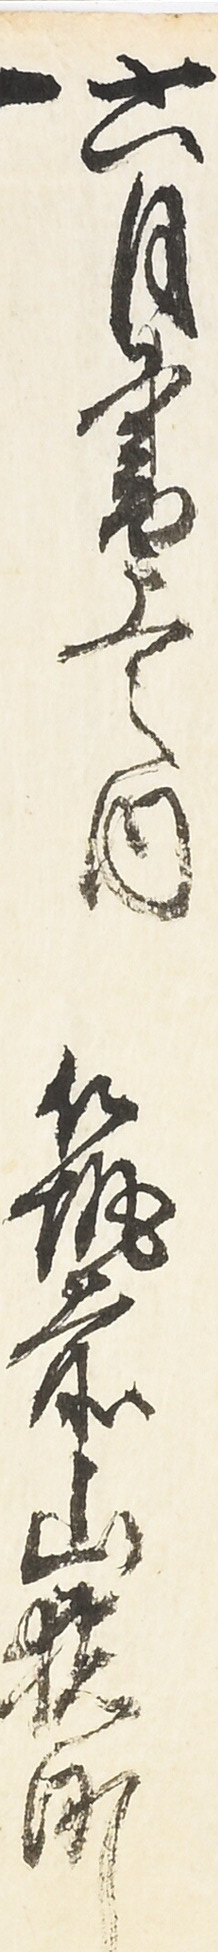六月書上之内筑前山猪町
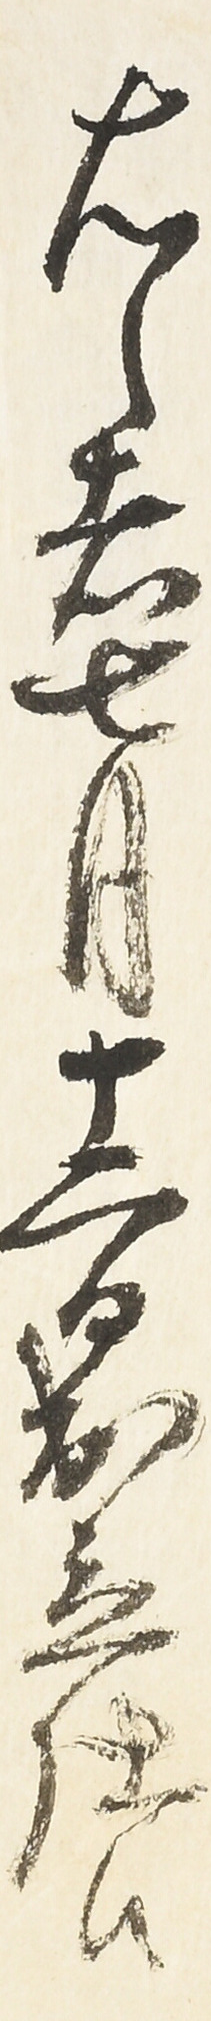右之者七月十二日出立仕候
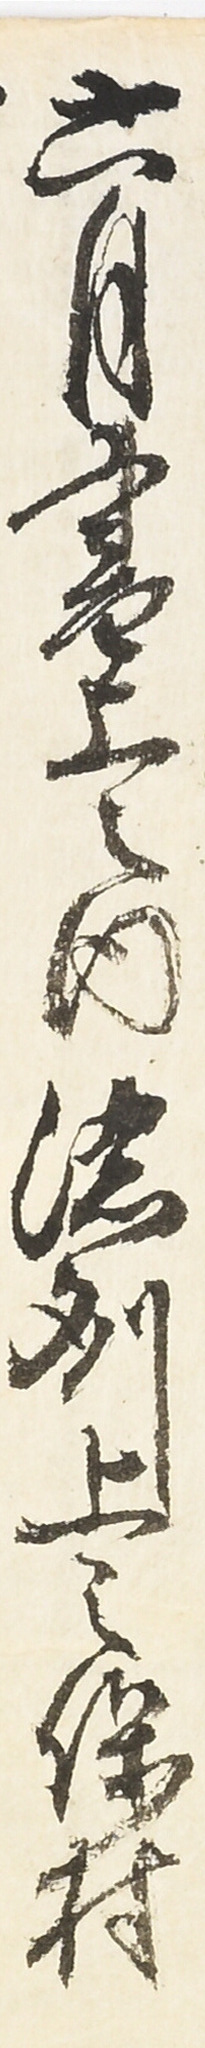六月書上之内濃州上之保村
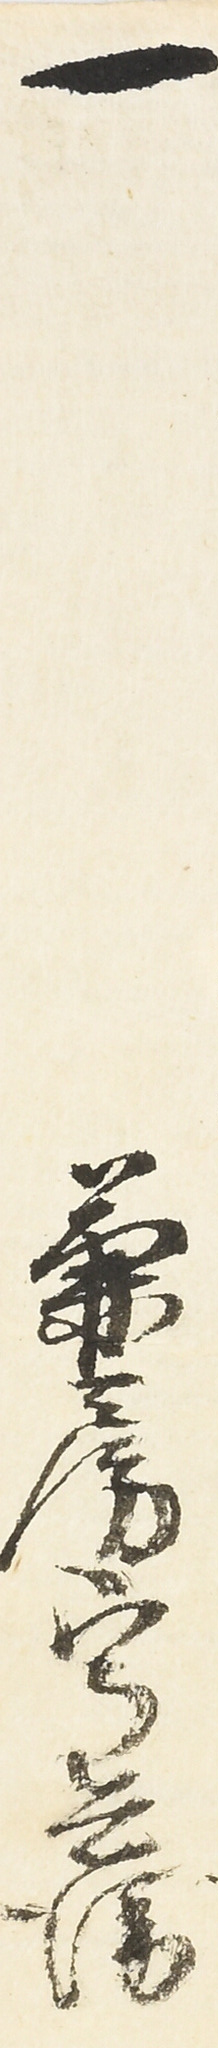一兼房宇兵衛
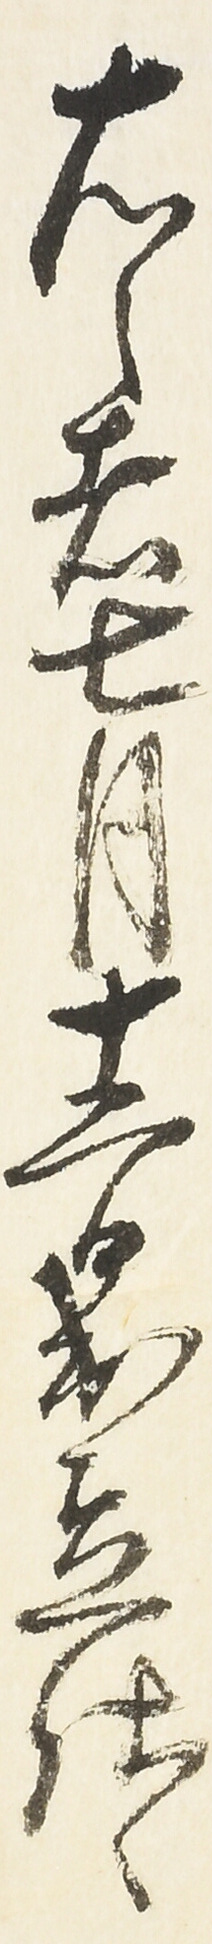右之者七月十二日出立仕候
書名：町中旅人泊控帳
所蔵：伊那市立高遠町図書館・合同会社AMANE
